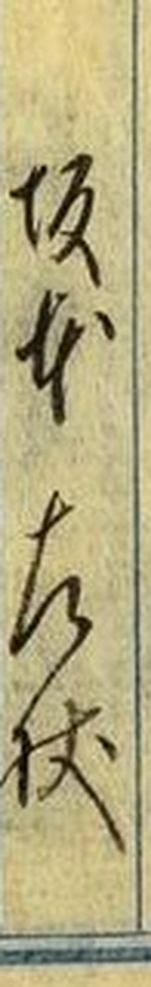坂本左杖
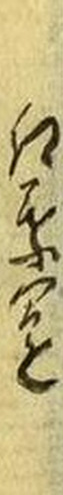紅葉園
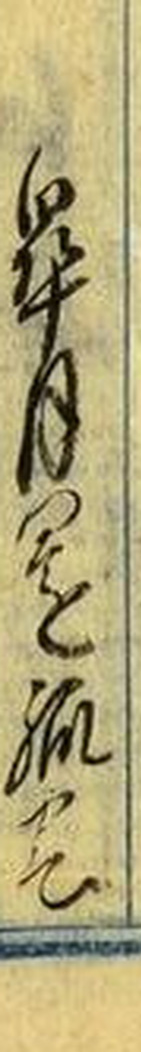皐月園孤雲
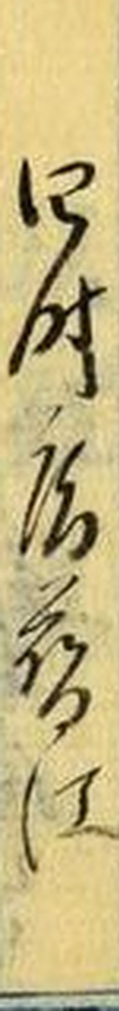四時庵暮江
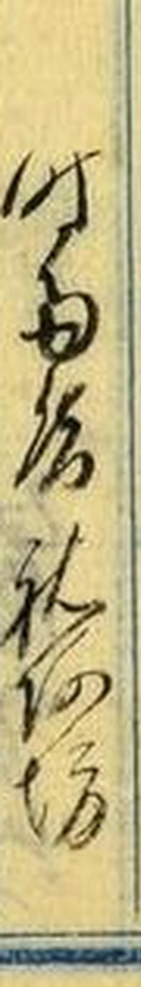時雨庵祐阿坊
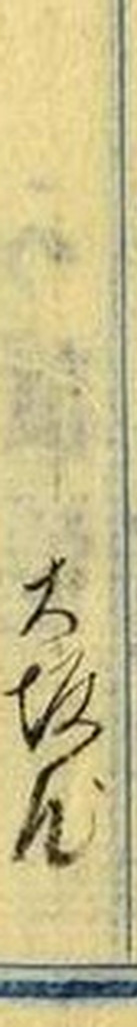大坂屋
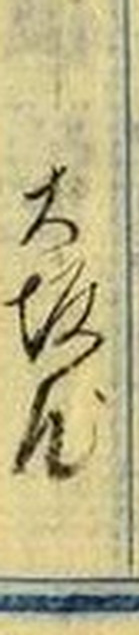大坂屋
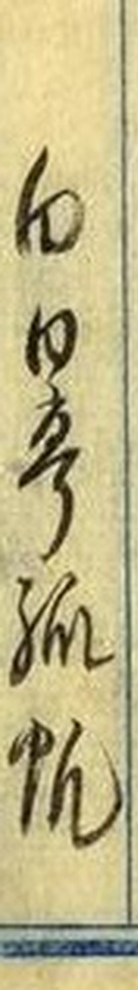白日亭孤帆

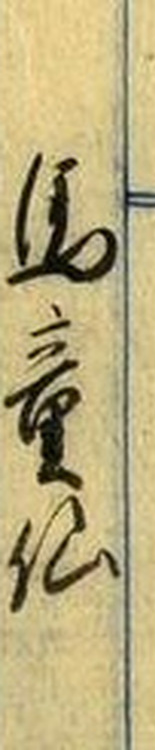馬童仙
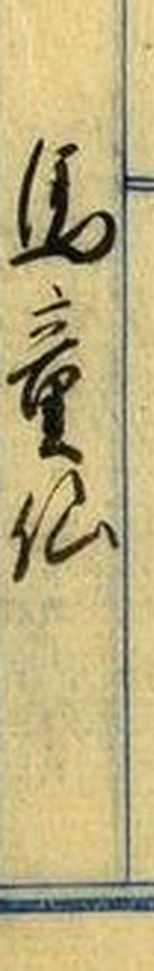馬童仙
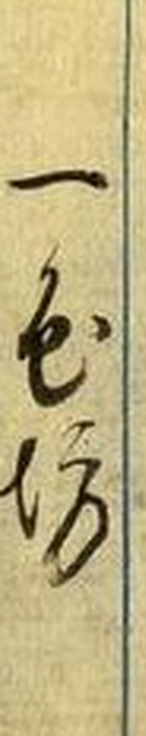一色坊
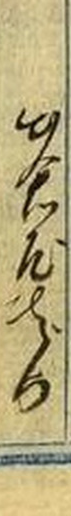土倉屋次郎右衛門
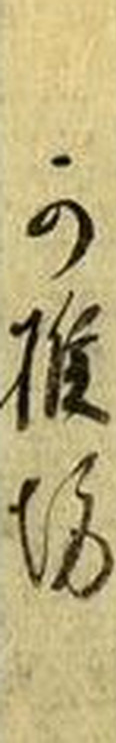可推坊
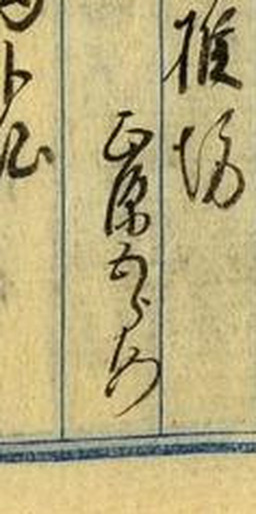正源五郎右衛門
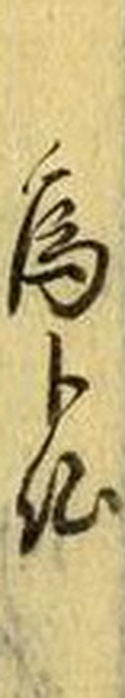為卜仙
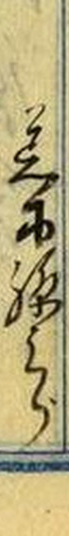荒木孫三郎
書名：温古集 四巻
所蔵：福井県文書館 Fukui Prefectural Archives
